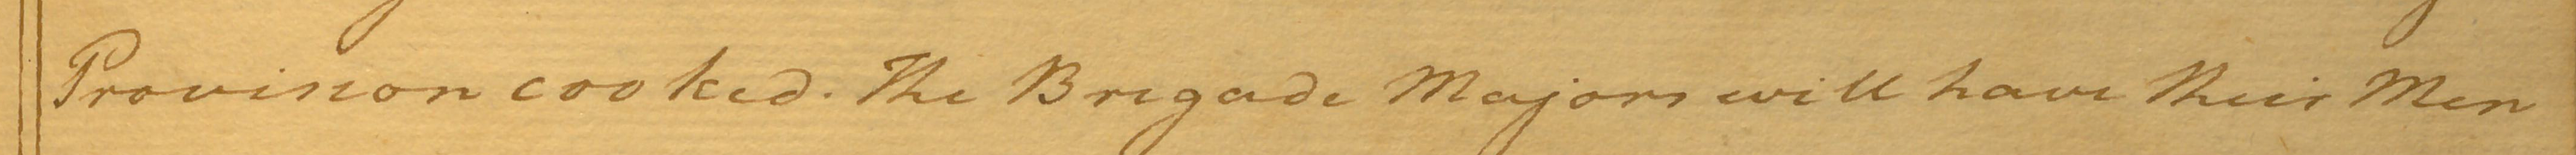Provisions cooked. The Brigade Majors will have their Men
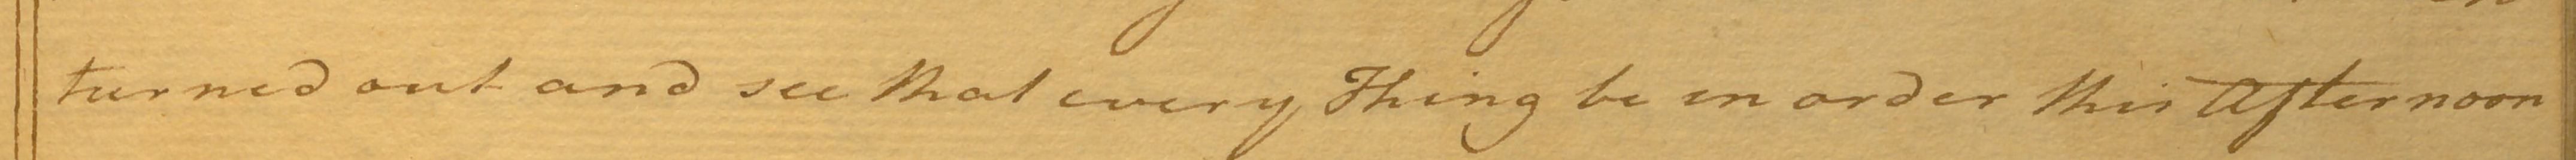turned out and see that every Thing be in order this Afternoon
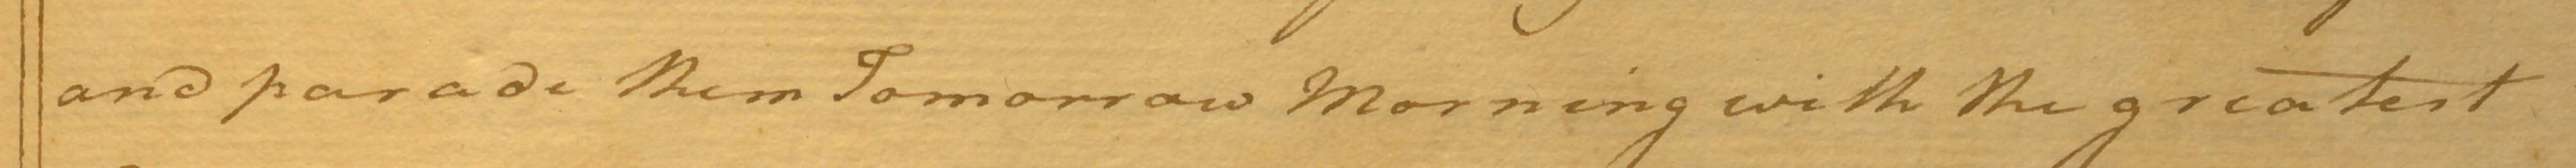and parade them Tomorrow Morning with the greatest
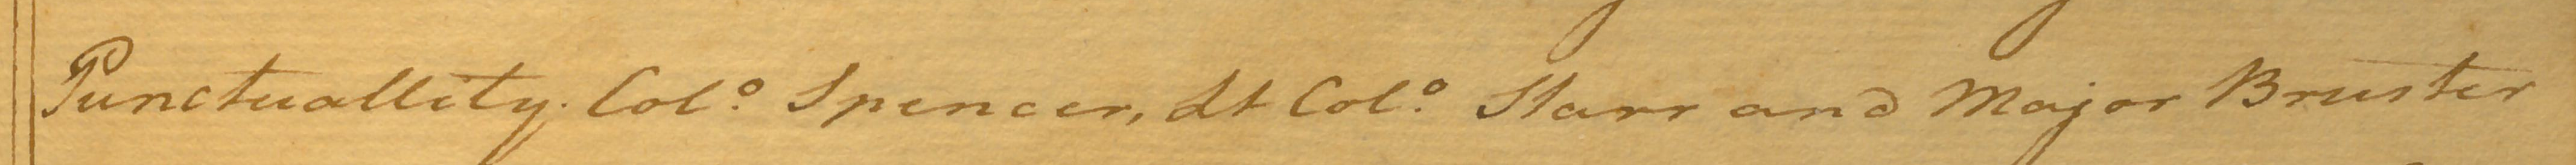Punctuality. Col^o. Spencer, Lt Col^o. Starr and Major Bruster
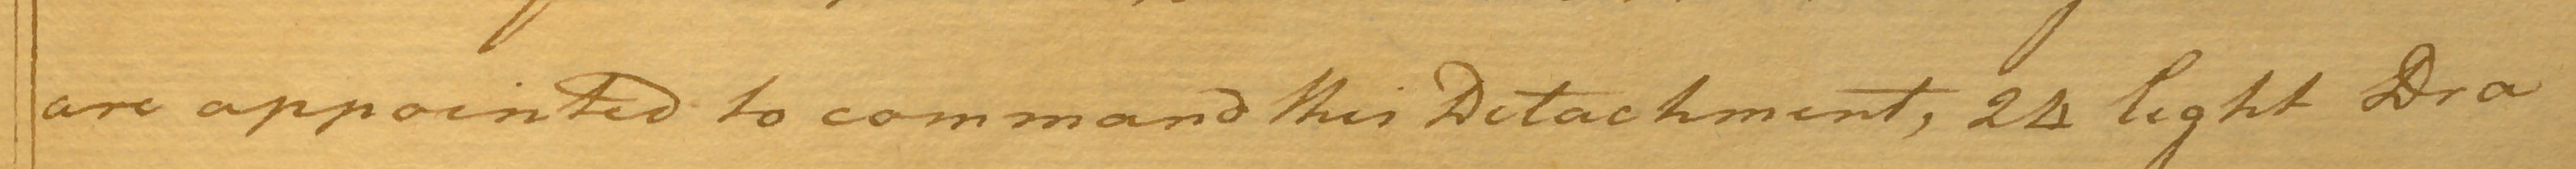are appointed to command this Detachment, 24 light Dra
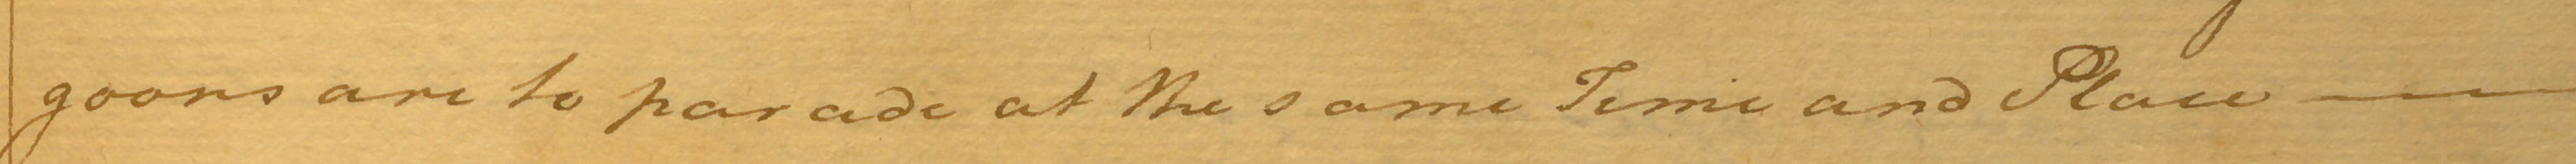goons are to parade at the same Time and Place-
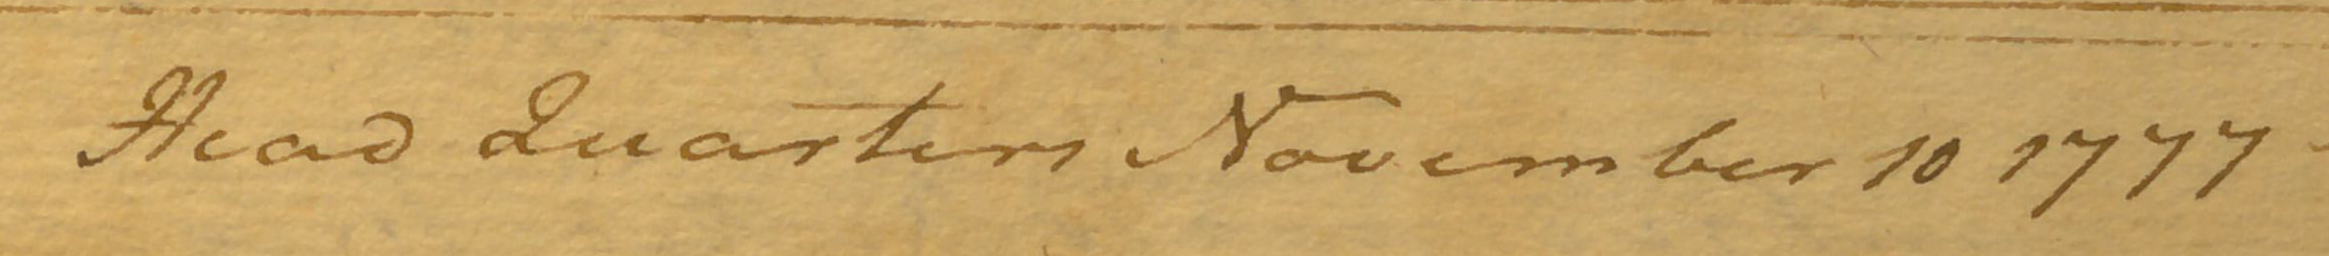Head Quarters November 10 1777
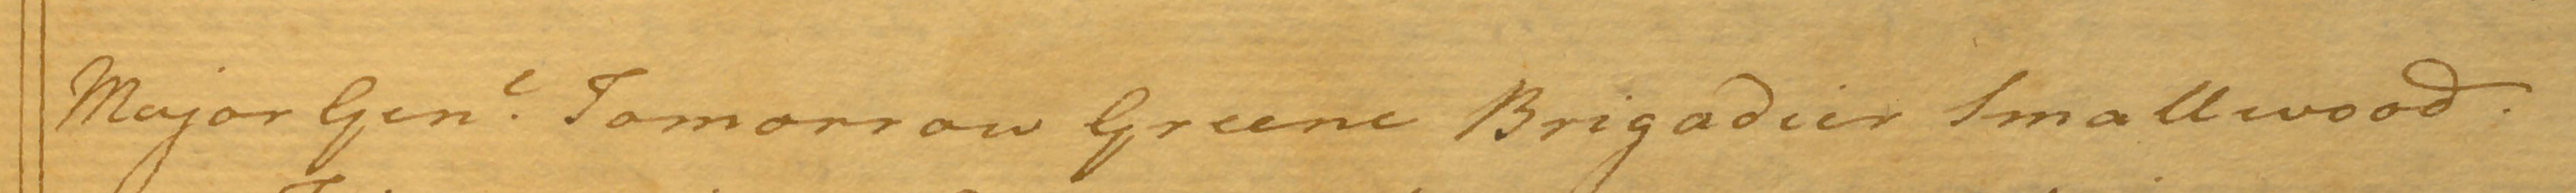Major Gen^l. Tomorrow Greene Brigadier Smallwood
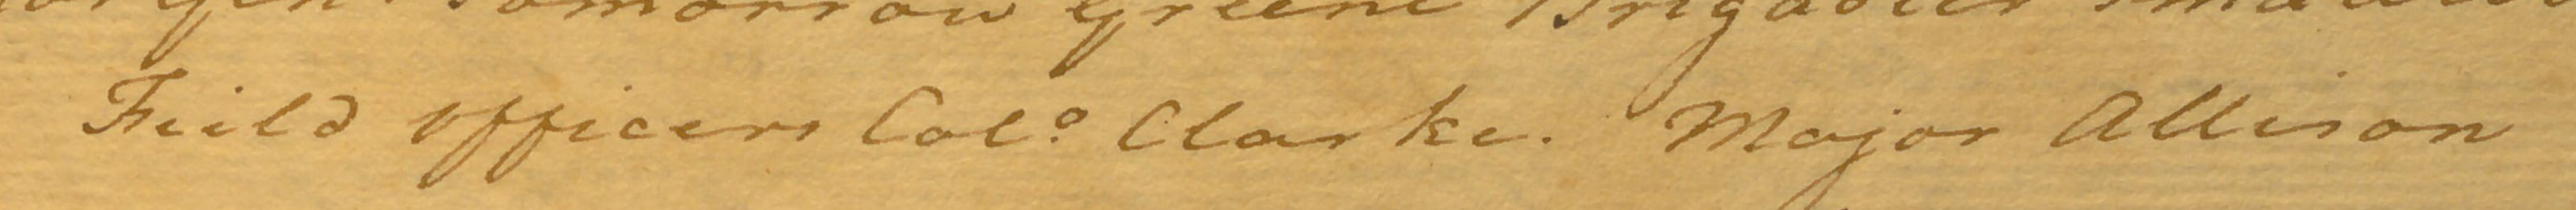Field officers Col^o. Clarke. Major Allison
